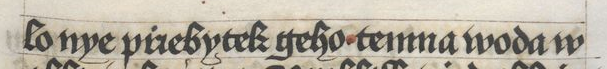lo nye pṙiebytek geho.temna woda w
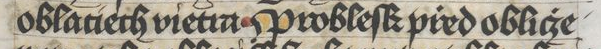oblaciech vietra.Probleſk pṙed oblicże¬
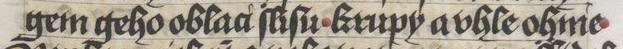gern geho oblaci ẛliſu.krupy a uhle ohnie.
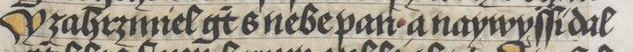Yzahrzmiel ḡt s nebe pan.a naywyẛẛí dal
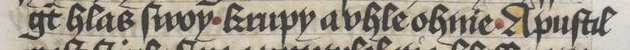ḡt hlas ſwoy.krupy a uhlé ohnie.A puſtil
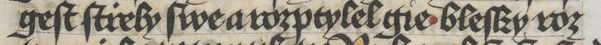geſt ſtṙely ſwe a rozptylel gie.bleſky roz¬
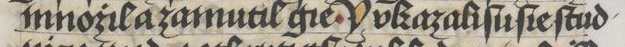mnożil a zamutil gie.Y ukazali ſu ſie ſtud¬
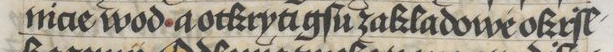nicie wod.a otkryti gſu zakladowé okrẛl¬
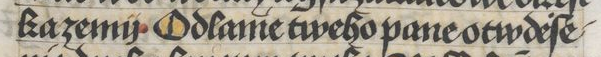ka zemij.Odlanie tweho pane otwdeẛe¬
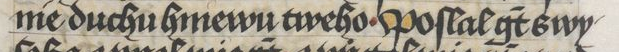nie duchu hnewu tweho.Poſlal ḡt s wy¬
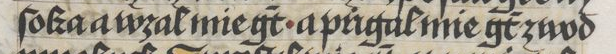ſoka a wzal mie ḡt.a pṙigal mie ḡt z wod
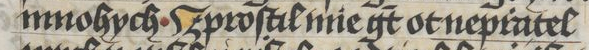mnohych.Zproſtil mie ḡt ot nepṙatel
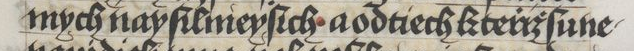mych nayſilneyẛích a odtiech kteṙiž ſu ne¬
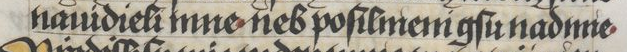navidieli mne.neb poſilnieni gſu nadmie.
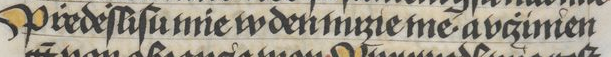Předeẛliſu mie w den mrzie mé.a ucżinien
